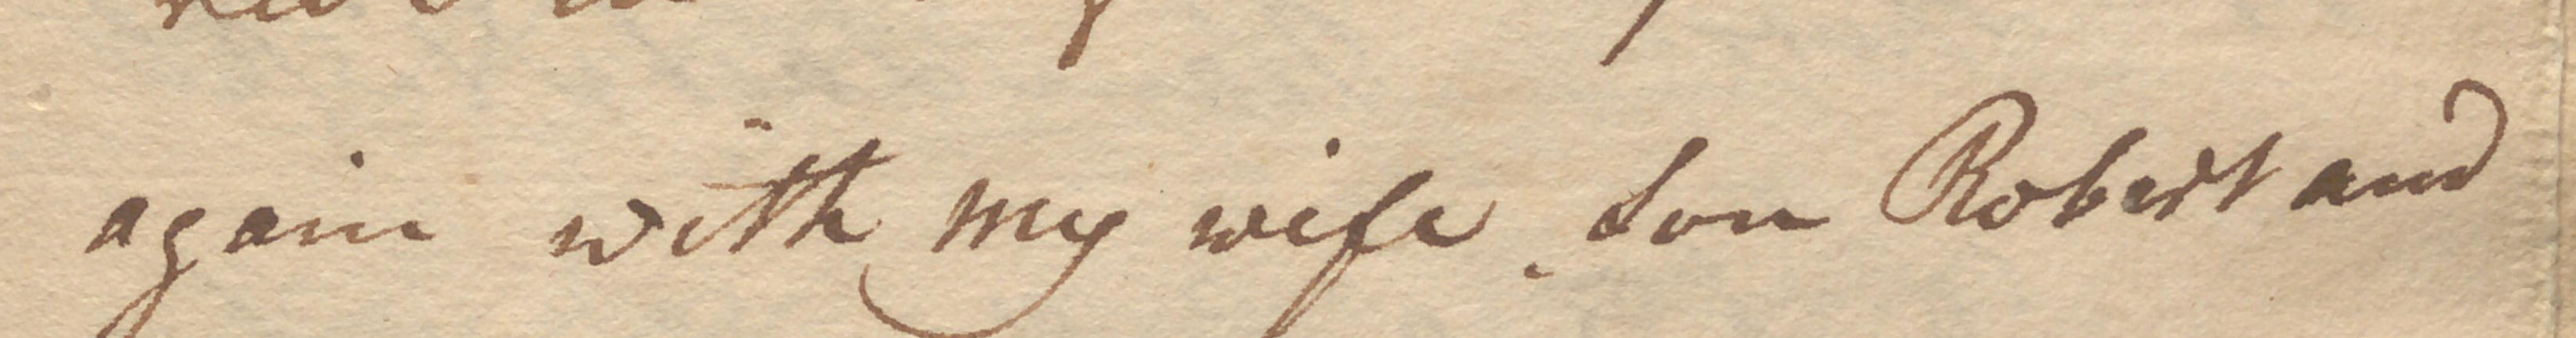again with my wife son Robert and
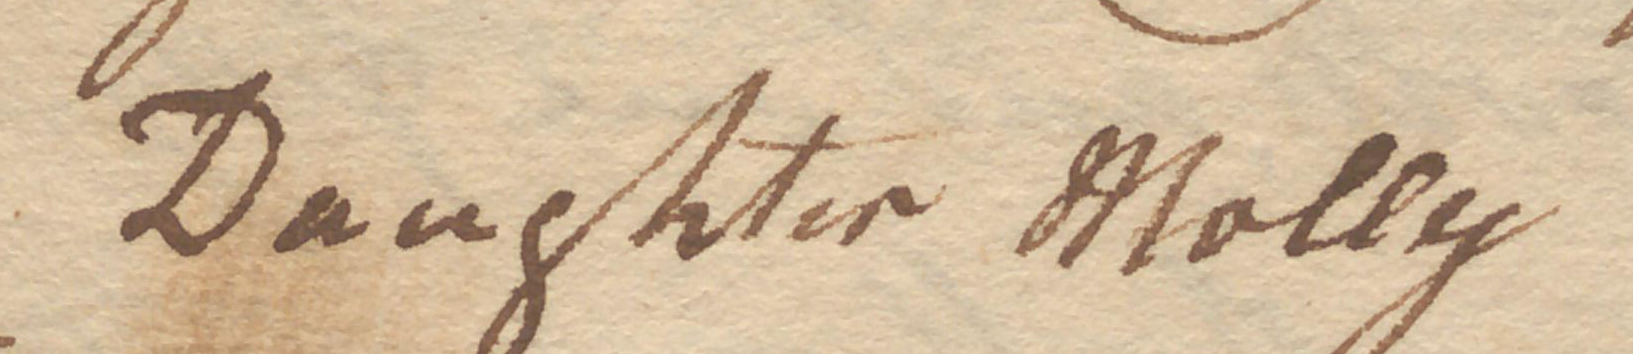Daughter Molly
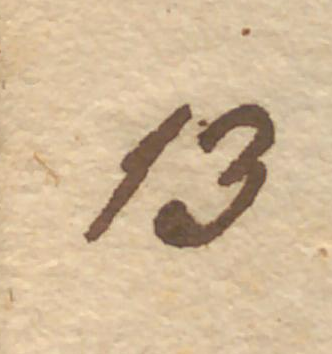13
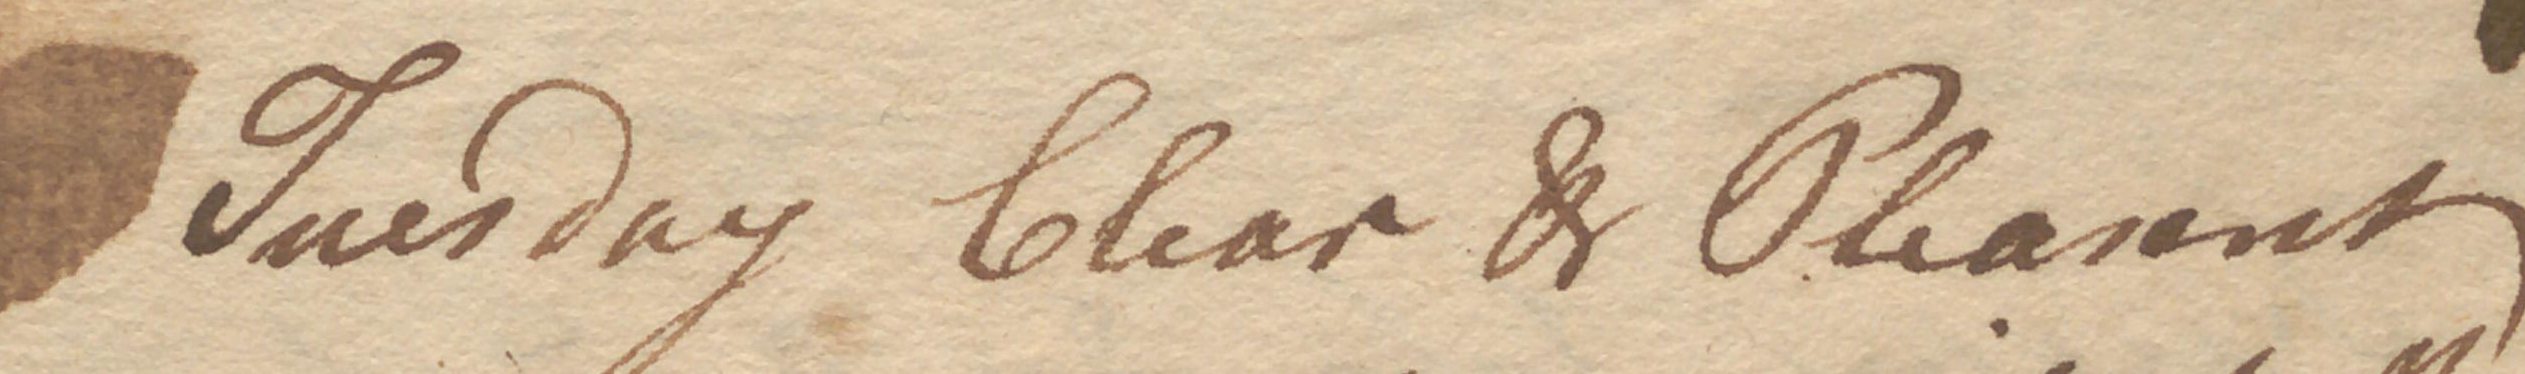Tuesday Clear & Pleasent
